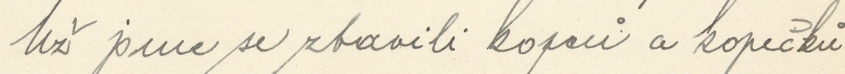Už jsme se zbavili kopců a kopečků
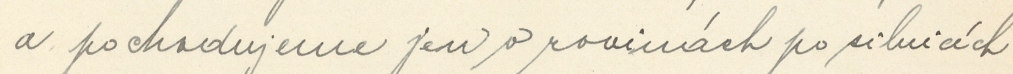a pochodujeme jen v rovinách po silnicích
